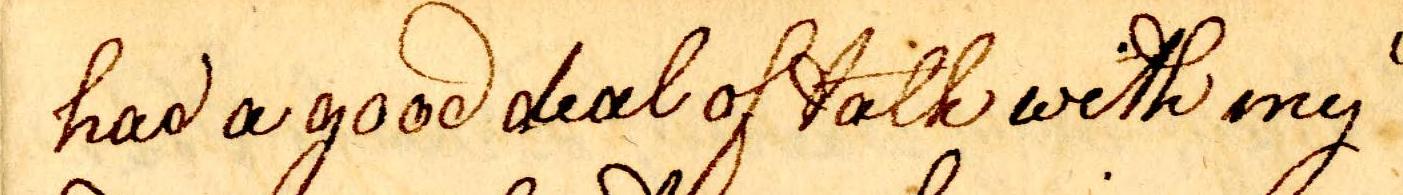had a good deal of talk with my
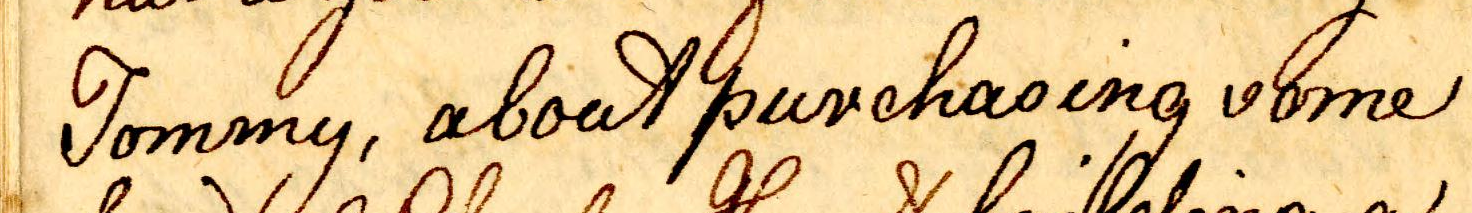Tommy, about purchasing some
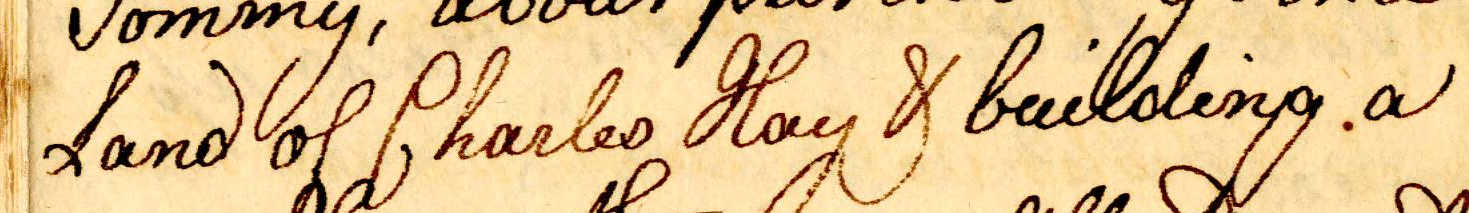Land of Charles Hay & building a
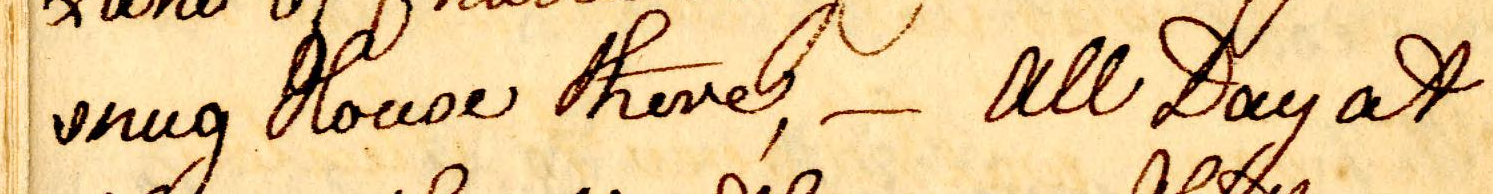snug House there,- All Day at
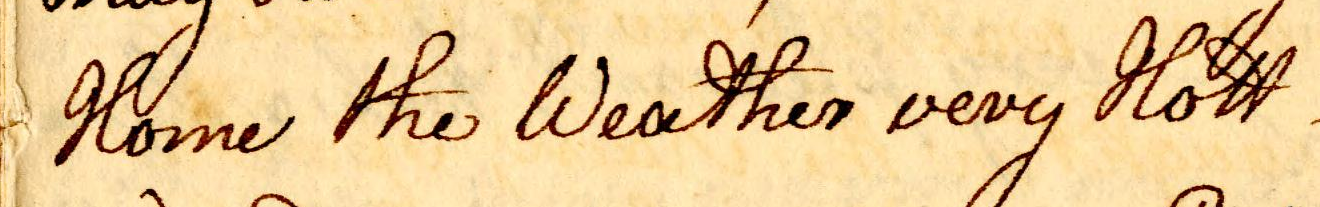Home the Weather very Hott
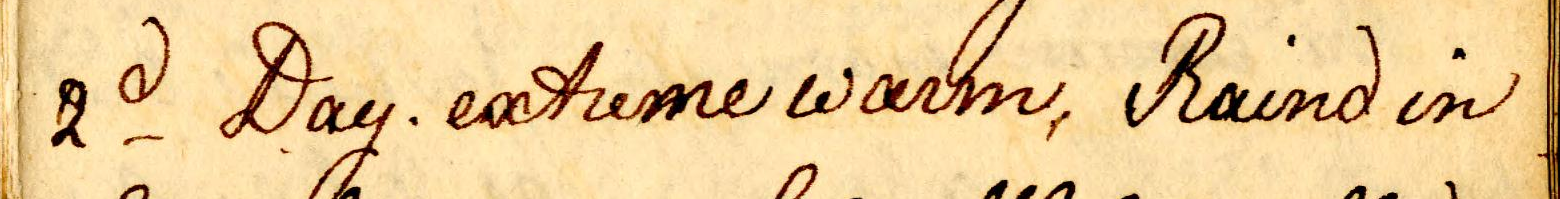2^d Day. extreme warm, Raind in
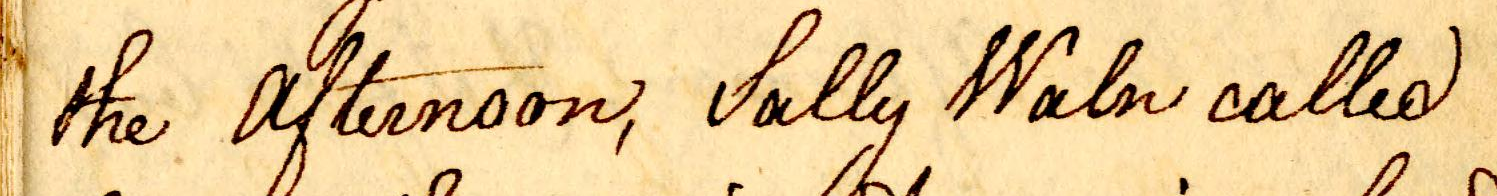the Afternoon, Sally Waln called
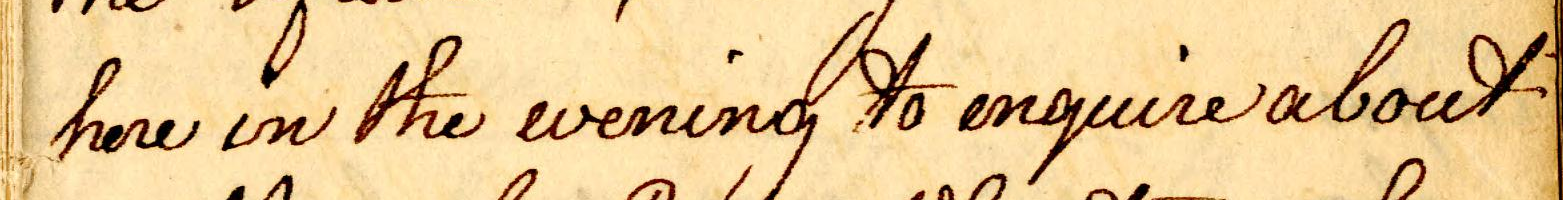here in the evening to enquire about
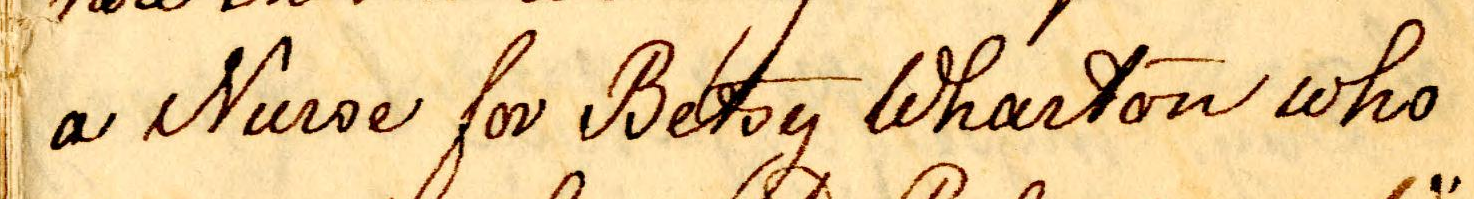a Nurse for Betsy Wharton who
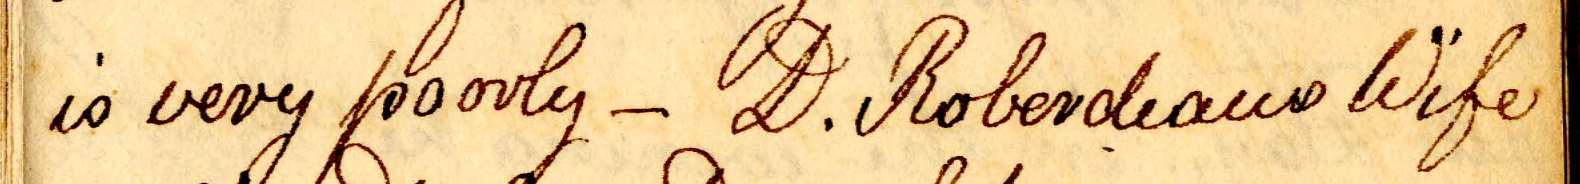is very poorly- D. Roberdeaus Wife
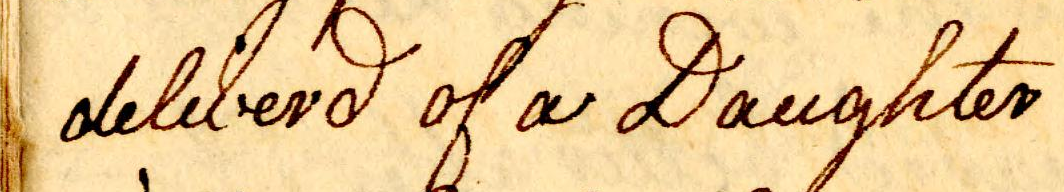deliverd of a Daughter
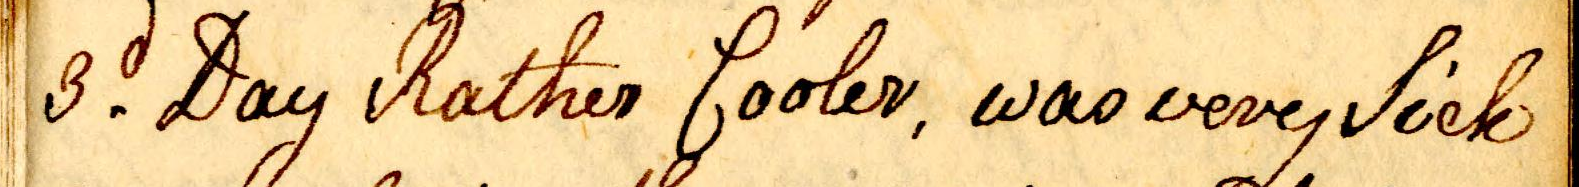3^d. Day Rather Cooler, was very Sick
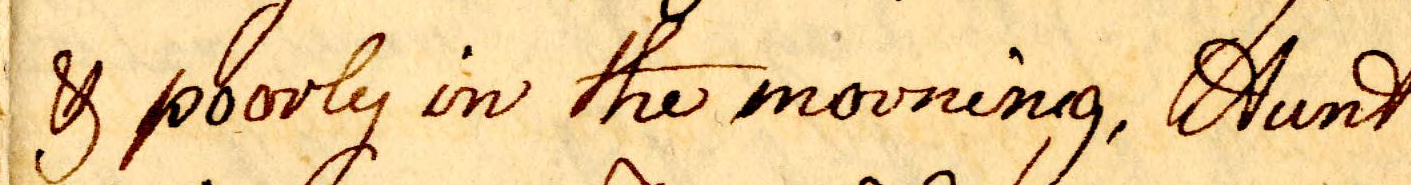& poorly in the morning, Aunt
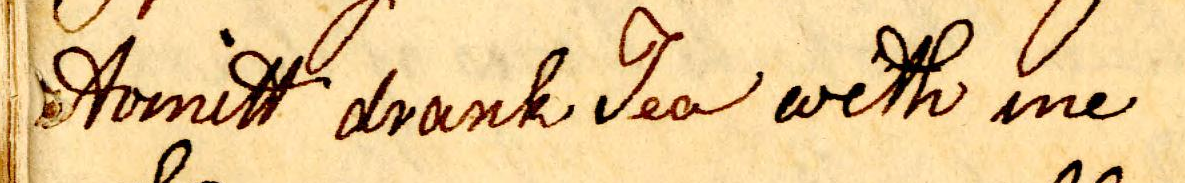Armitt drank Tea with me
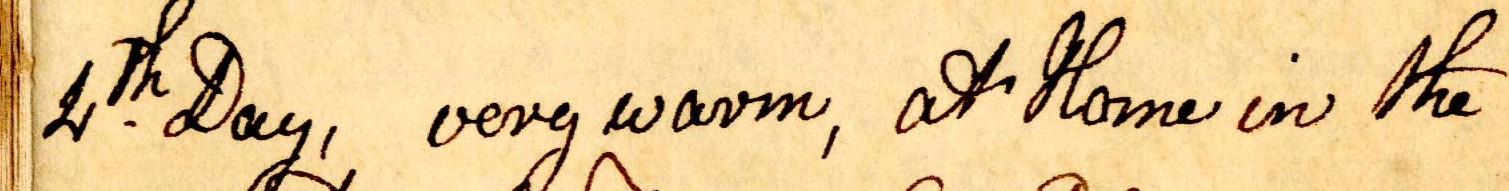4^th Day, very warm, at Home in the
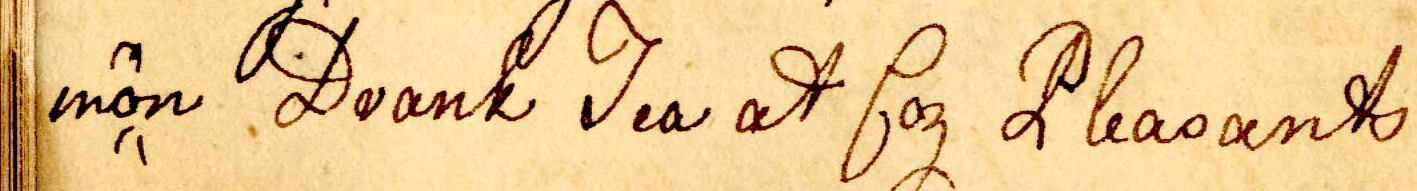mo^rn Drank Tea at Coz Pleasants
